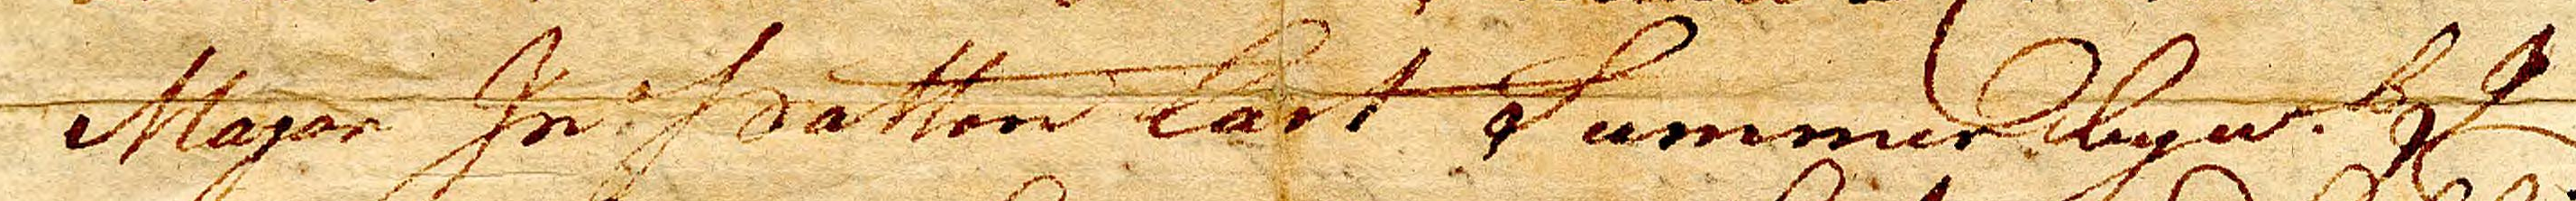Major Jn^o. Patton Earl Summer by w^ch. I
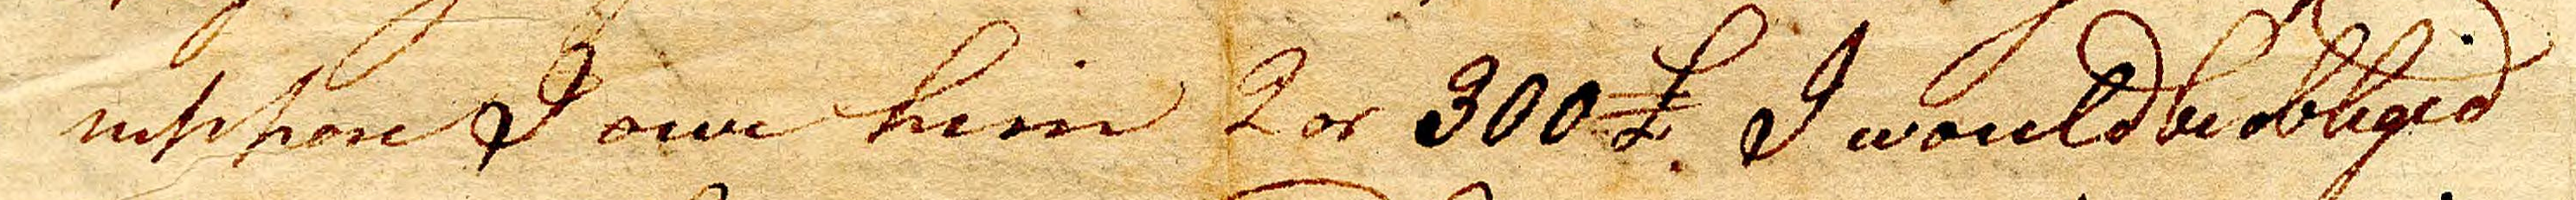suppose I owe him for 300£ I would be obliged
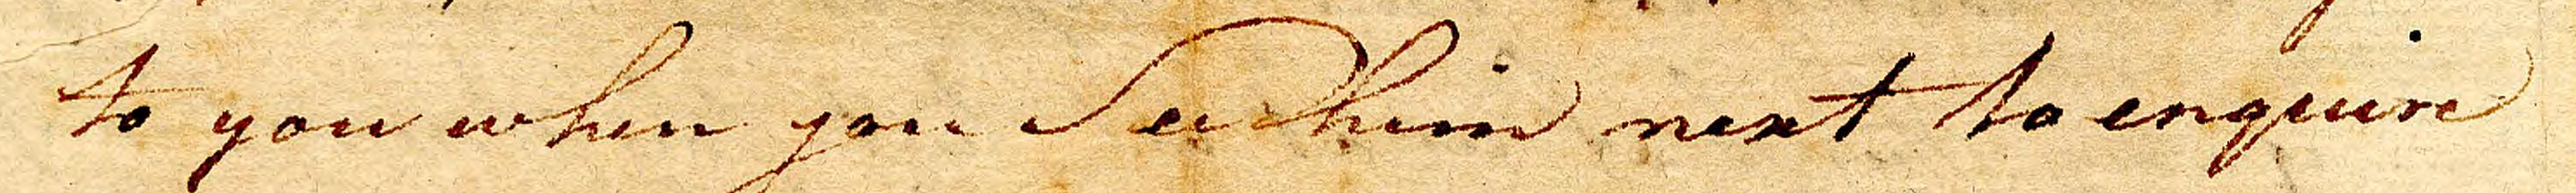to you when you See him next to enquire
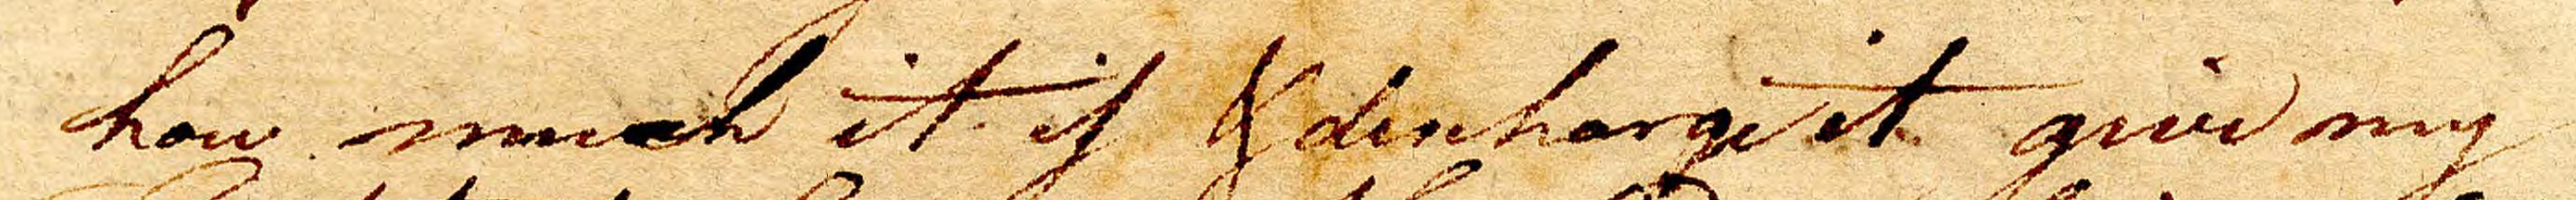how much it is & discharge it give my
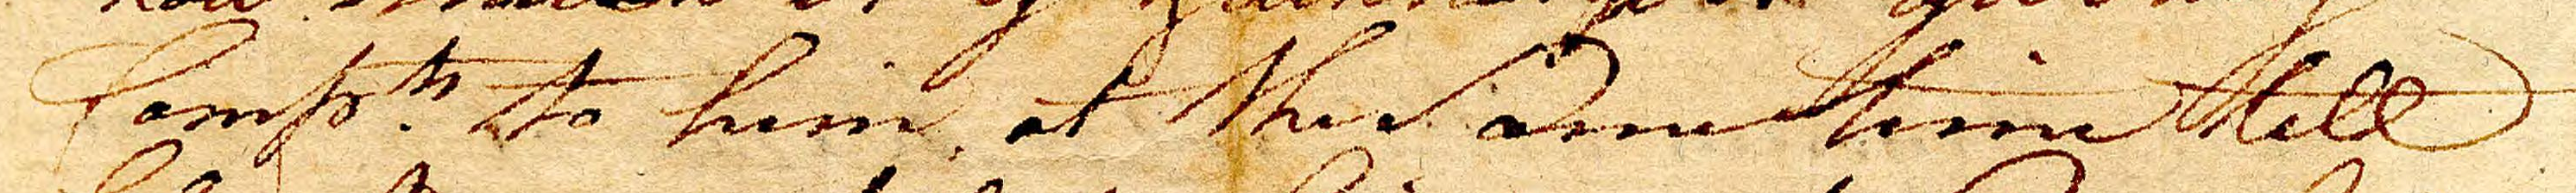Comp^ts. to him at the Same time tell
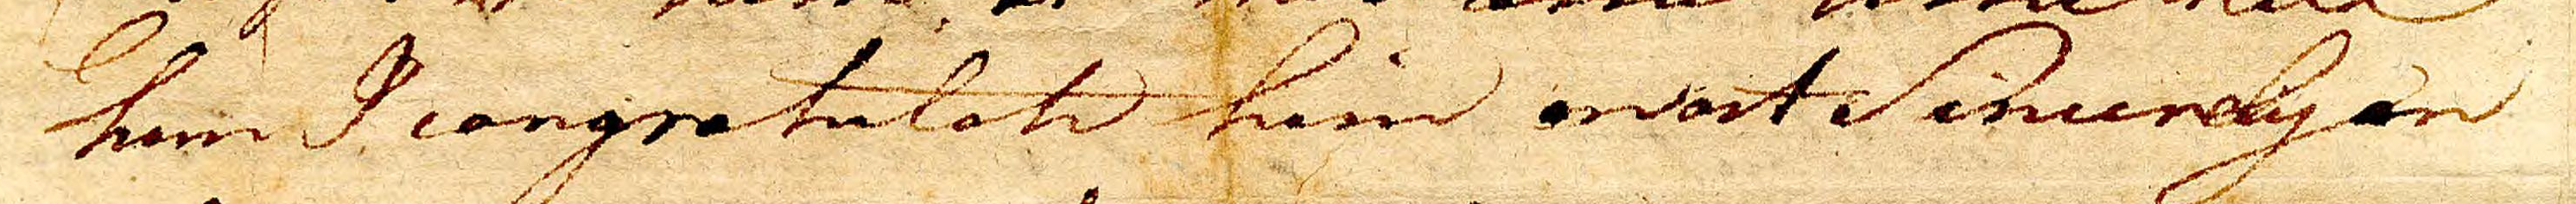him I congratulate him most Sincerely on
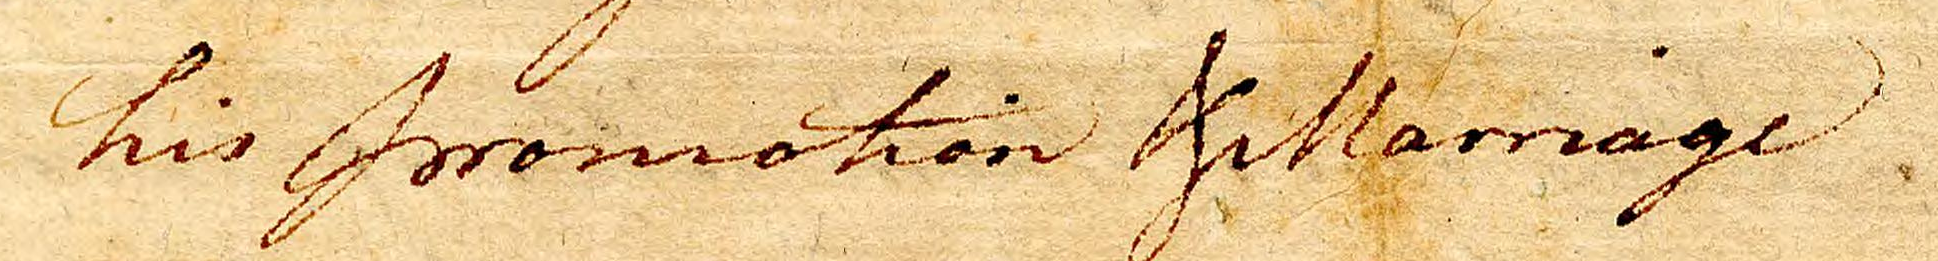his Promotion & Marriage
